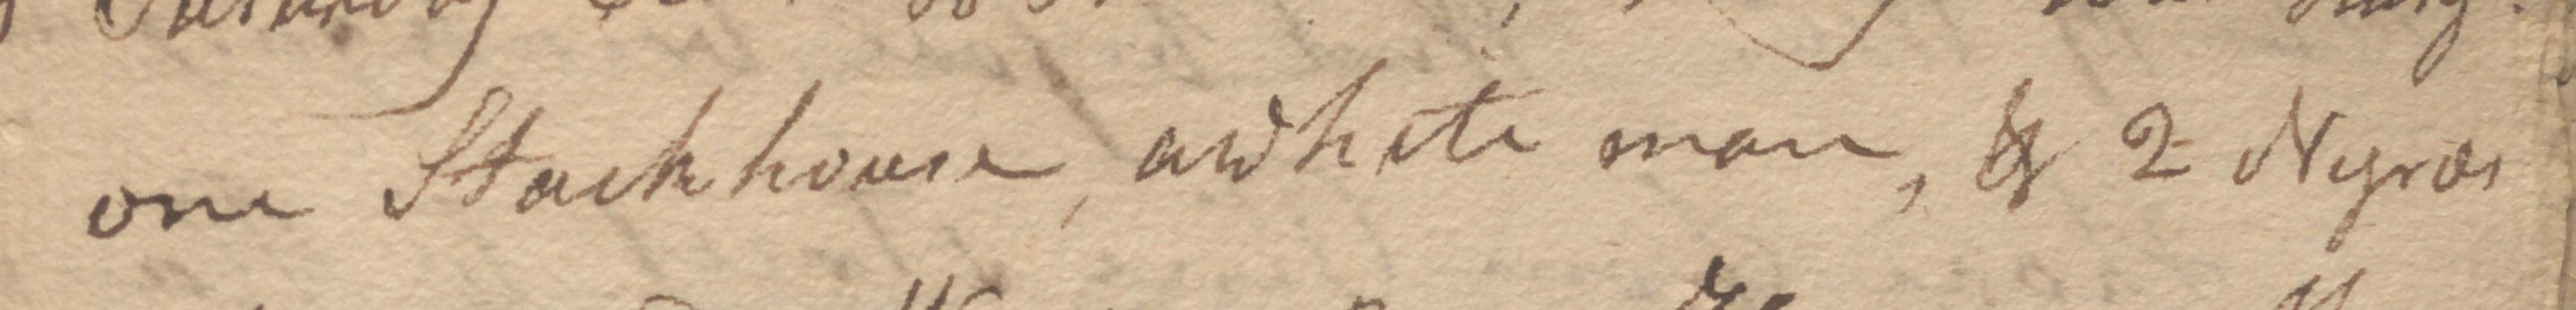one Stackhouse a white man, & 2 Negros
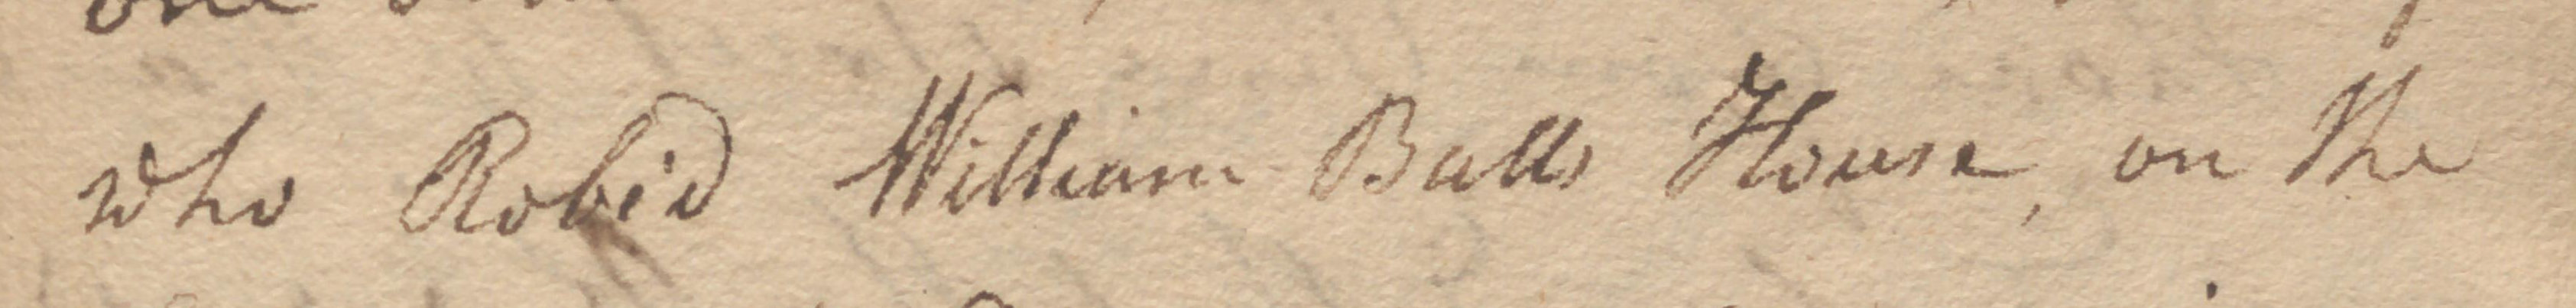who Robed William Balls House on the
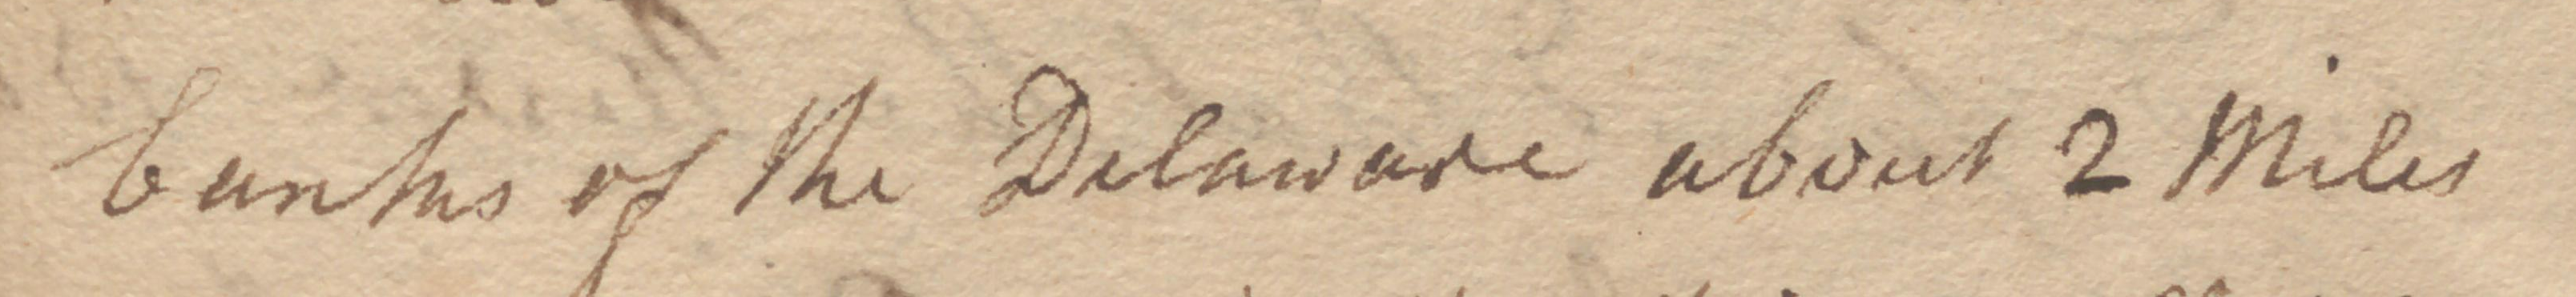banks of the Delaware about 2 Miles
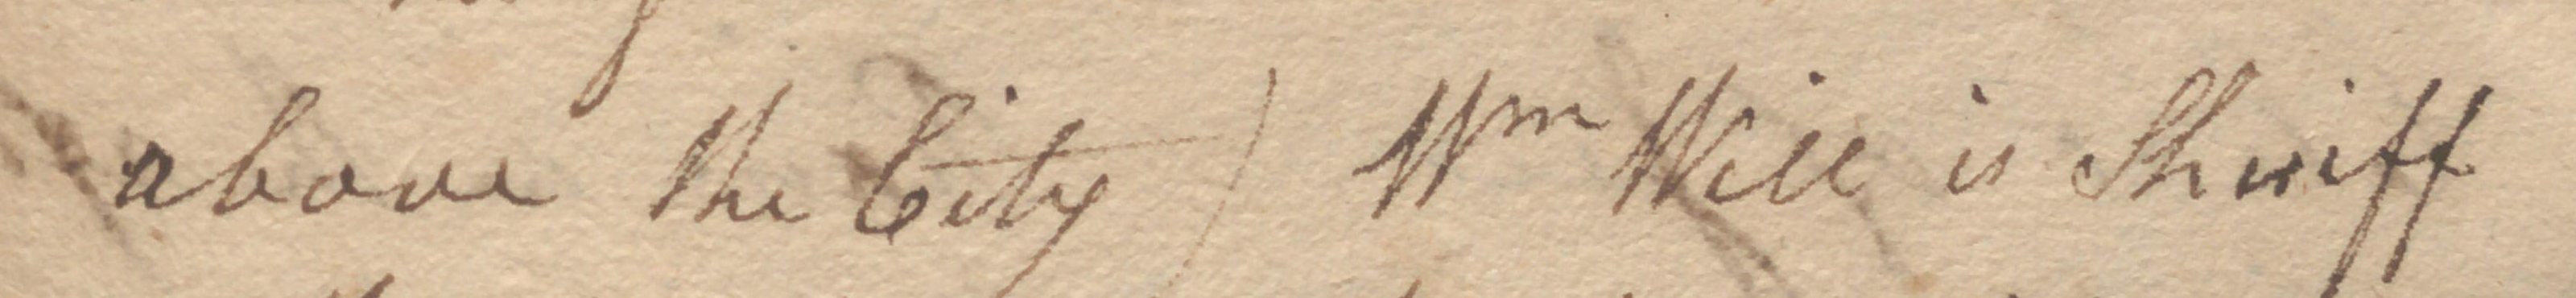above the City W^m. Will is Sheriff
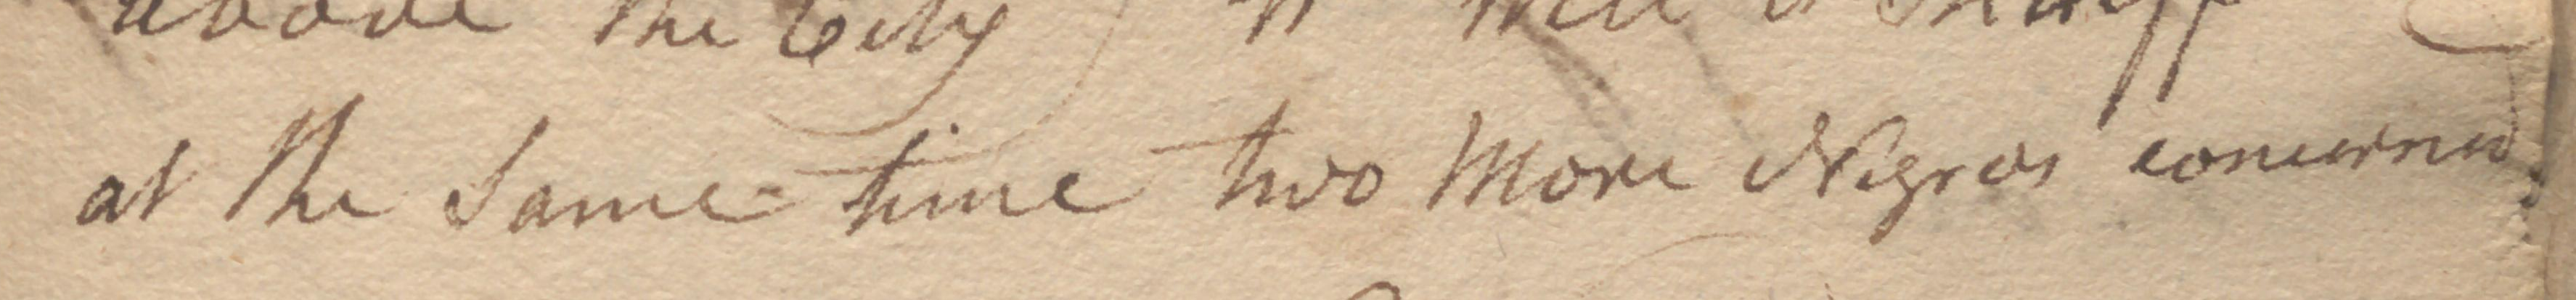at the same time two More Negros concerned
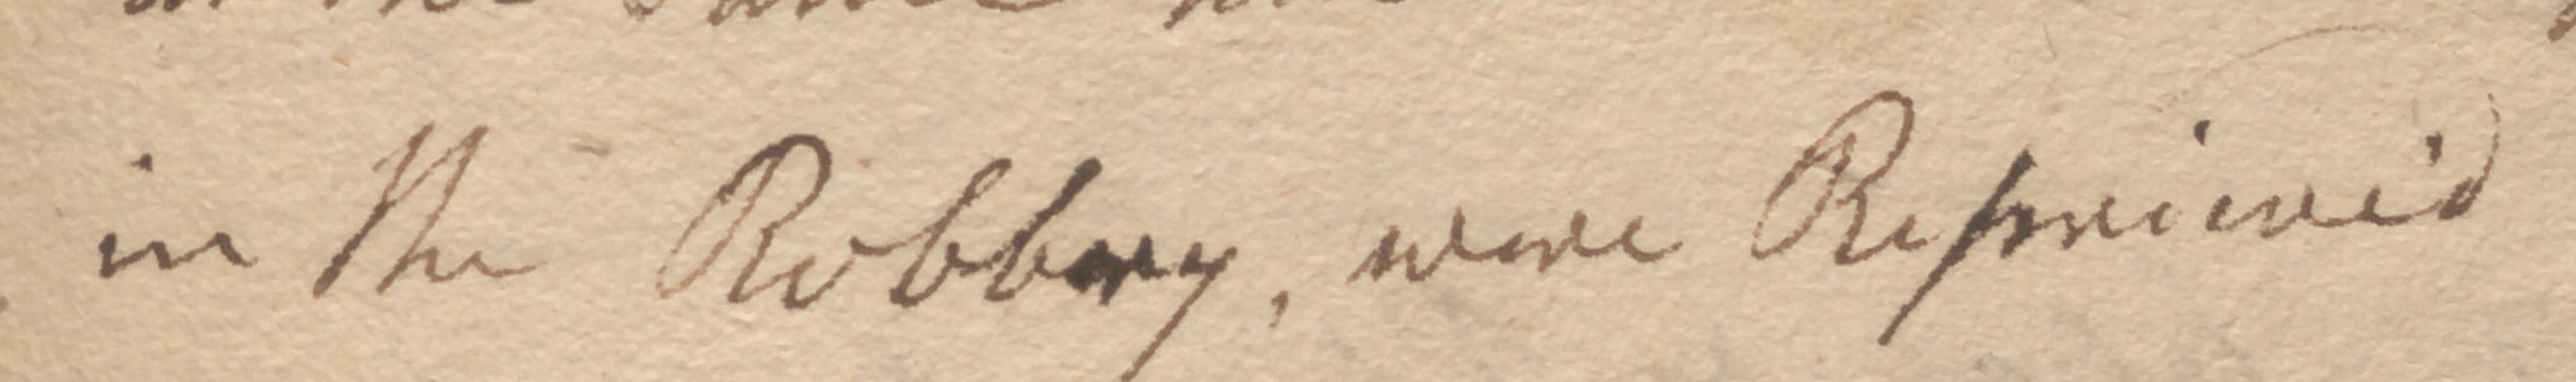in the Robbery were Repreive'd
